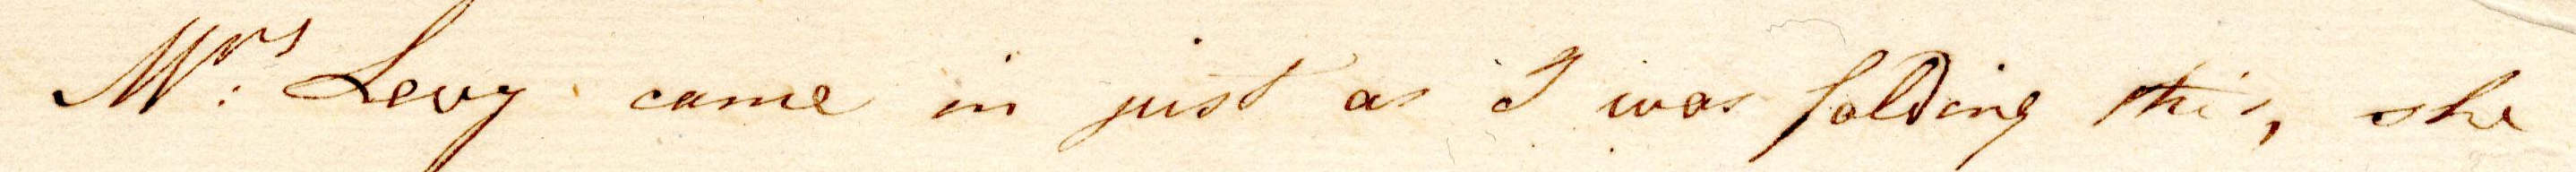M^rs. Levy came in just as I was folding this, she
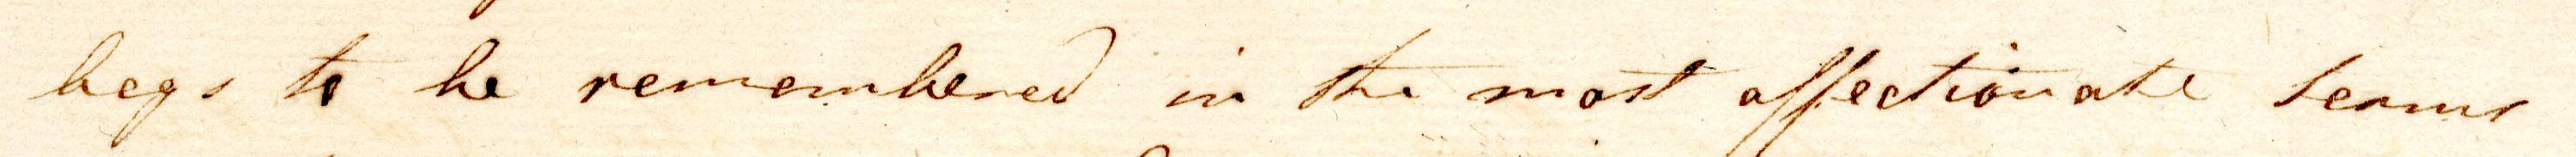begs to be remembered in the most affectionate terms
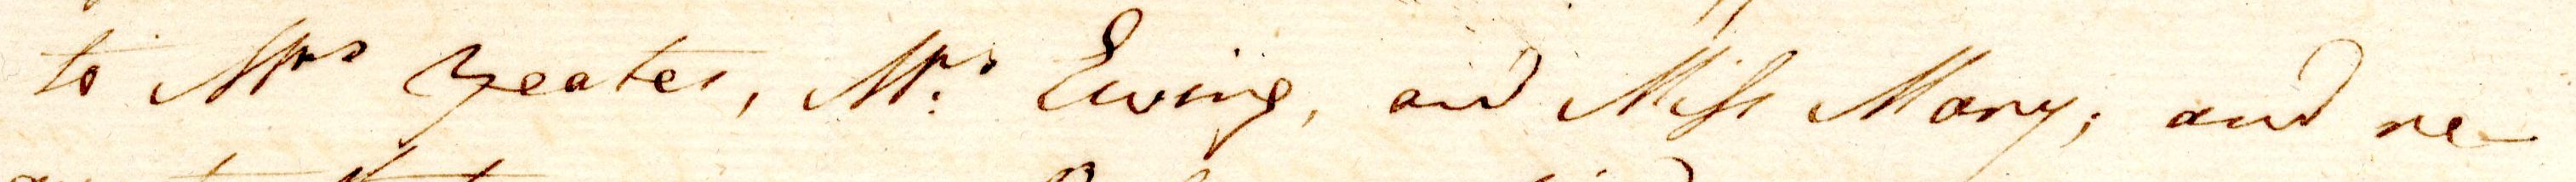to M^rs. Yeates, M^rs. Wing, and Miss Mary; and re-
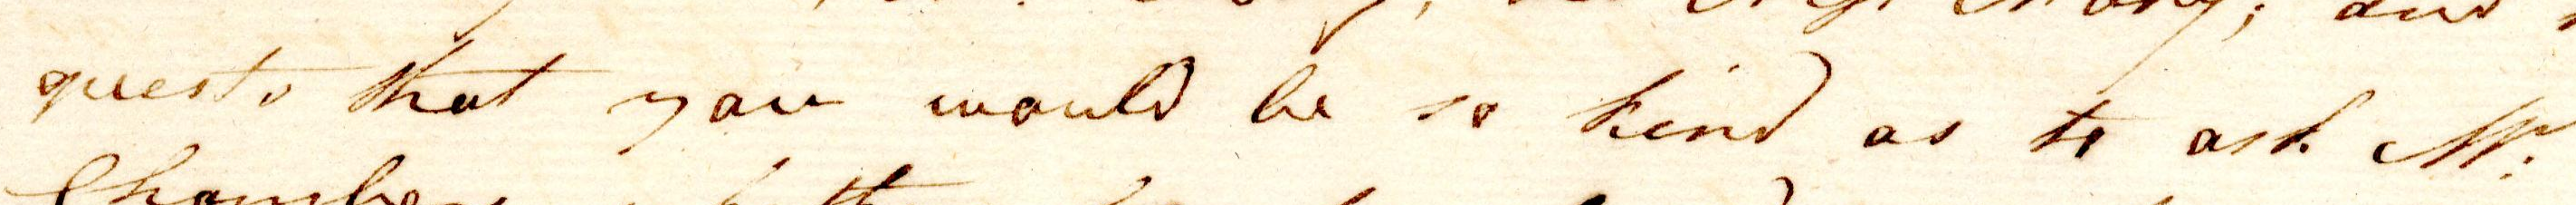-quests that you would be so kind as to ask M^r.
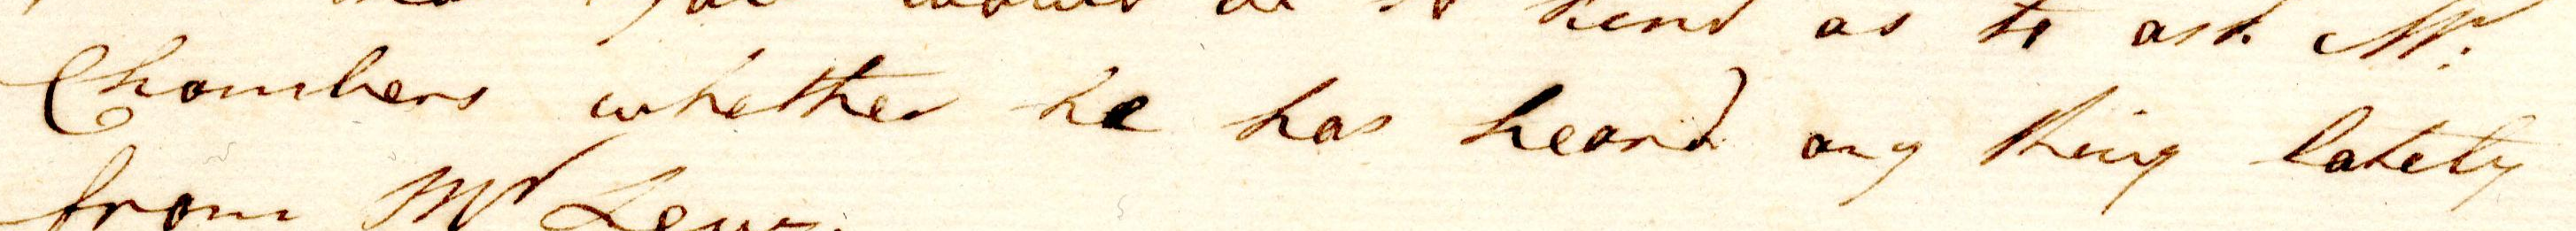Chambers whether he has heard any thing lately
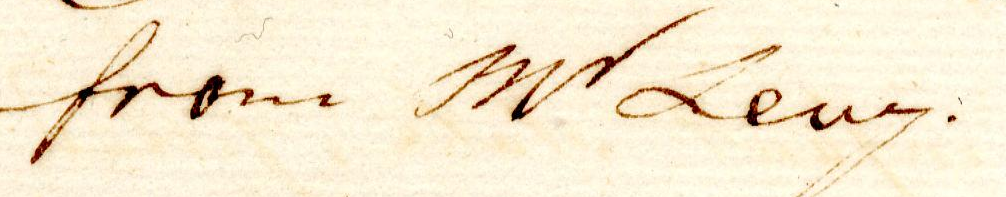from M^r Levy.
